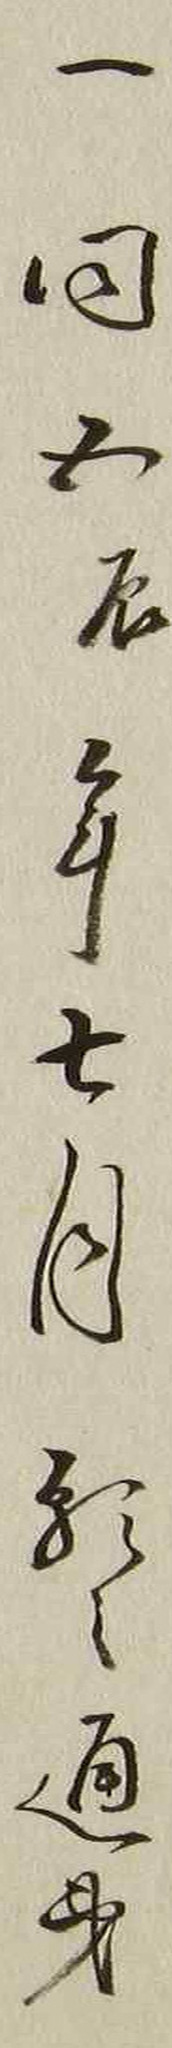一同五辰年七月願之通弟
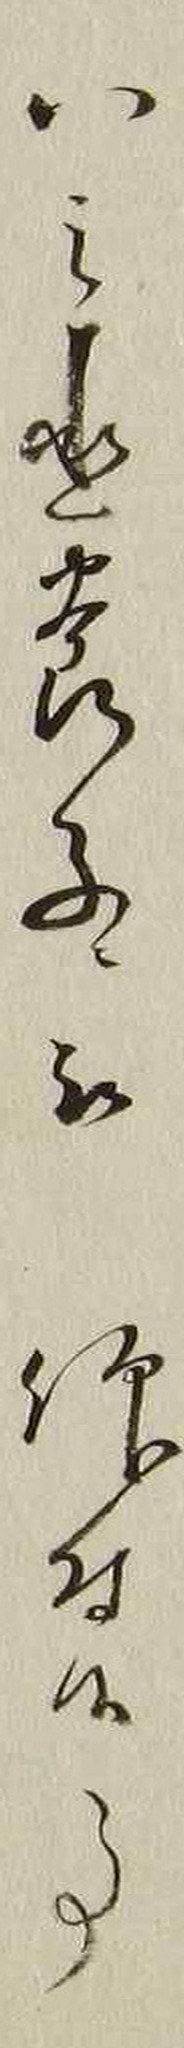八之丞養子に被仰付候事
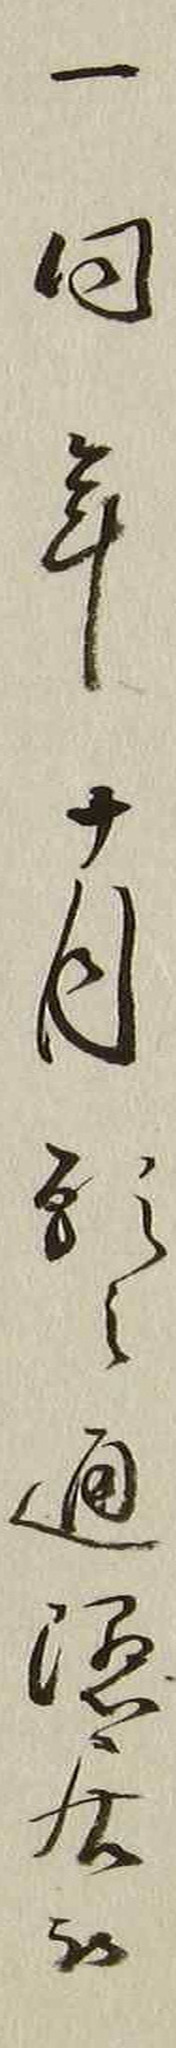一同年十月願之通隠居被
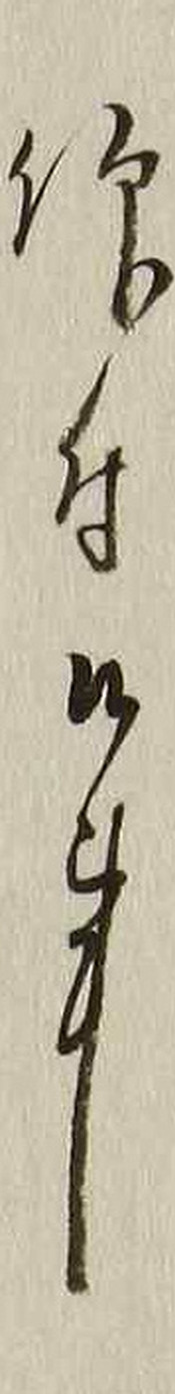仰付候事
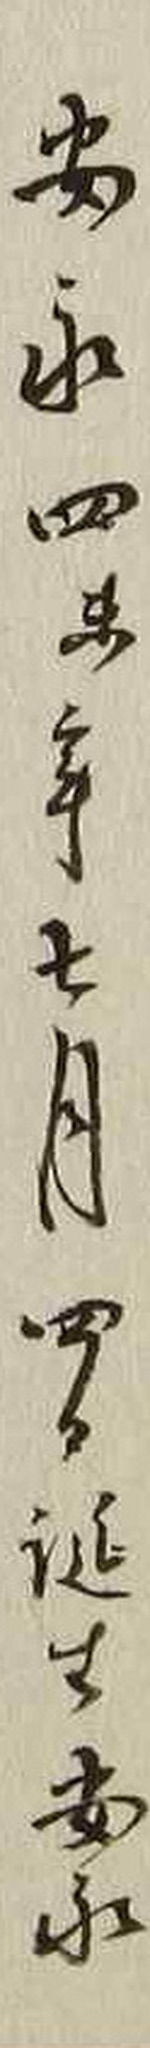安永四未年七月四日誕生安永
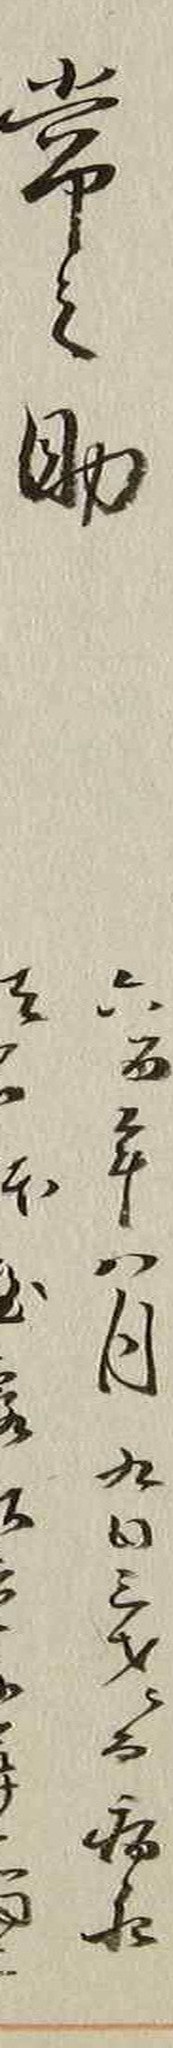常之助六酉年八月九日三才に而病死
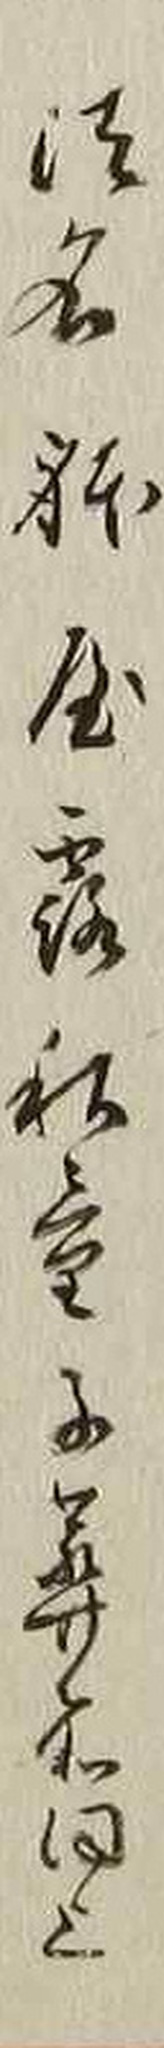法名体屋露私童子葬所同上
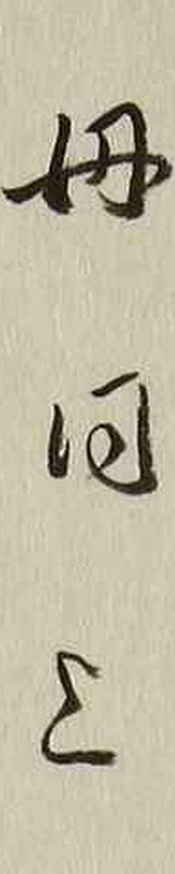母同上
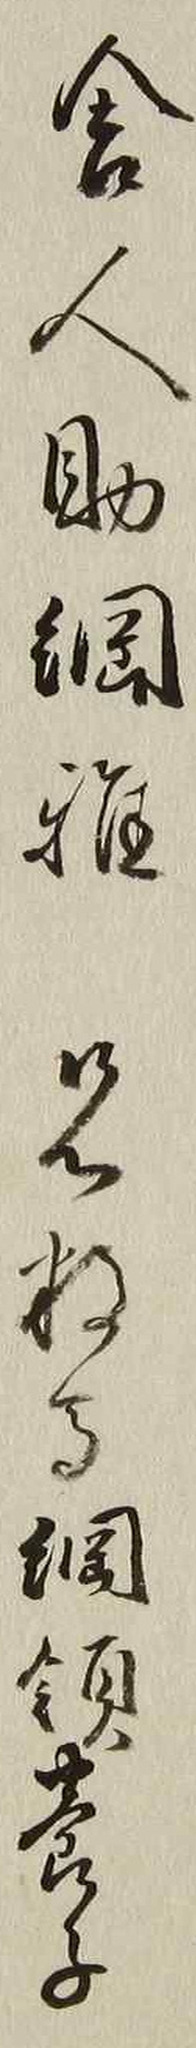舎人助綱雅兄数馬綱領養子
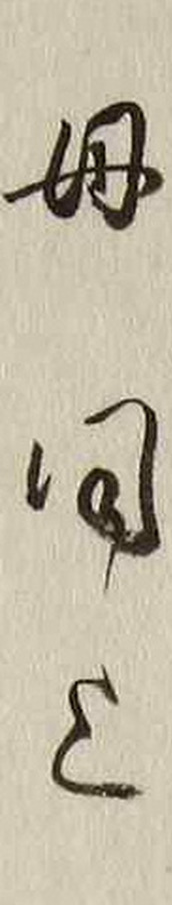母同上
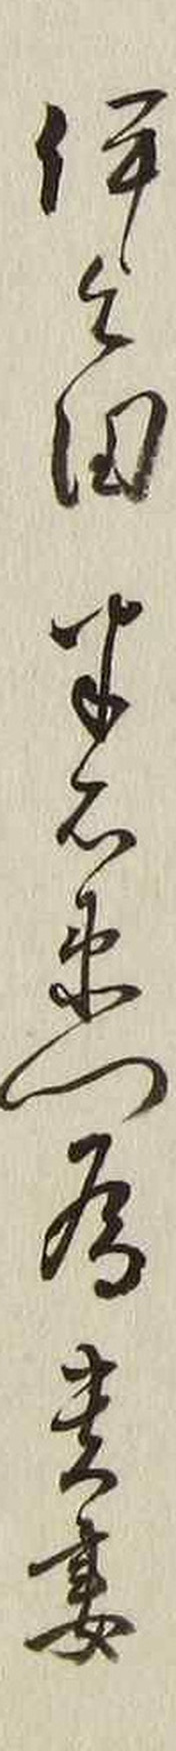伊与田半右衛門為貴妻
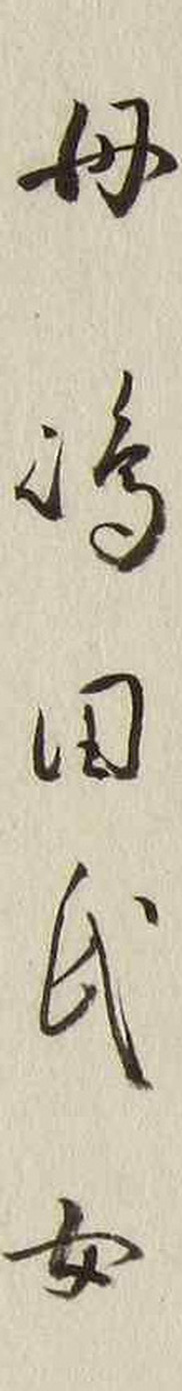母島田氏女

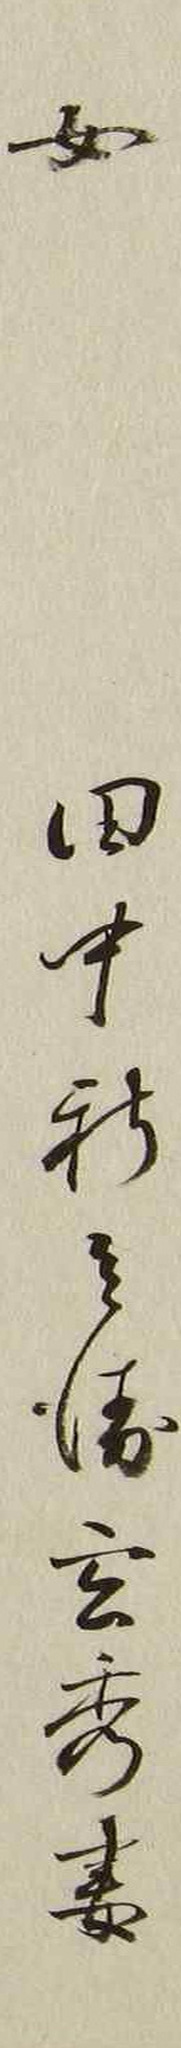女田中新兵衛玄秀妻
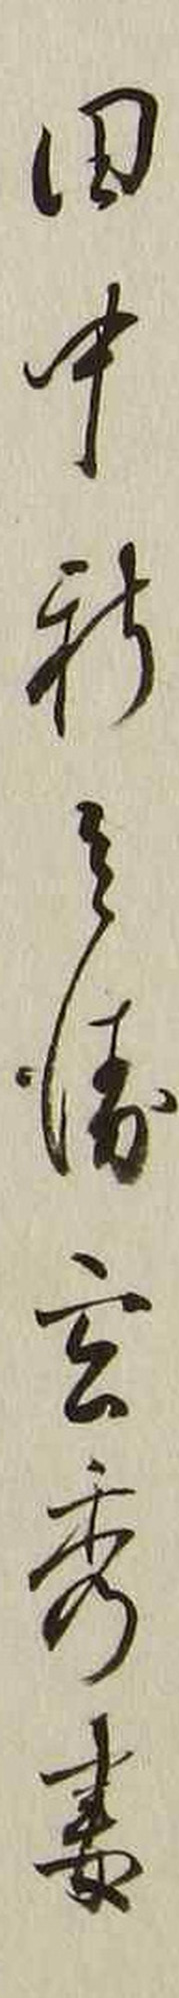女田中新兵衛玄秀妻
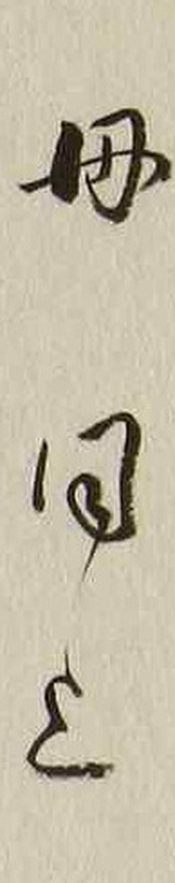母同上
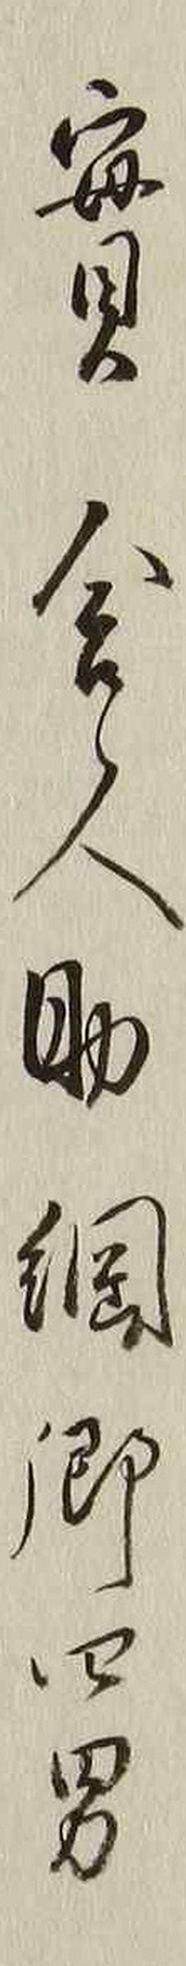実舎人助綱郷四男
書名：諸士系譜　巻之159　な之部1
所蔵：会津若松市立会津図書館
